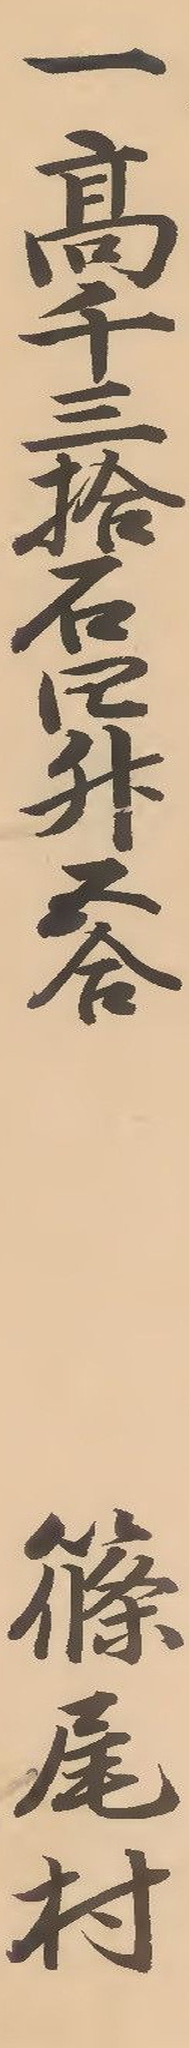一高千三拾石四升五合篠尾村

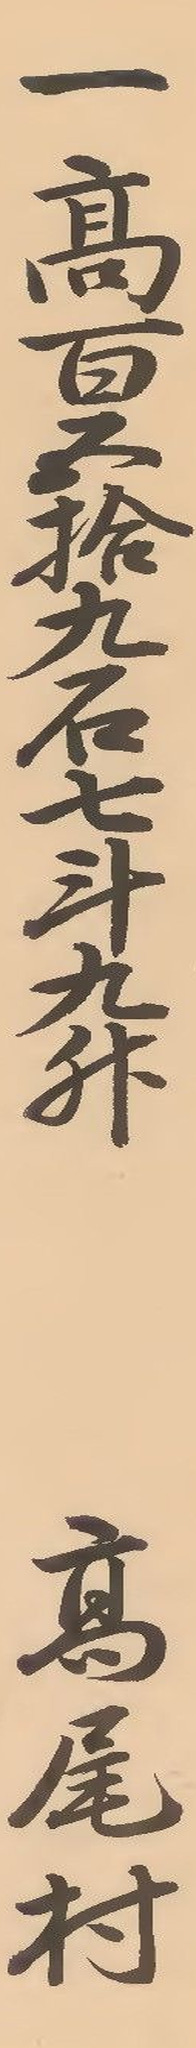一高百五拾九石七斗九升高尾村
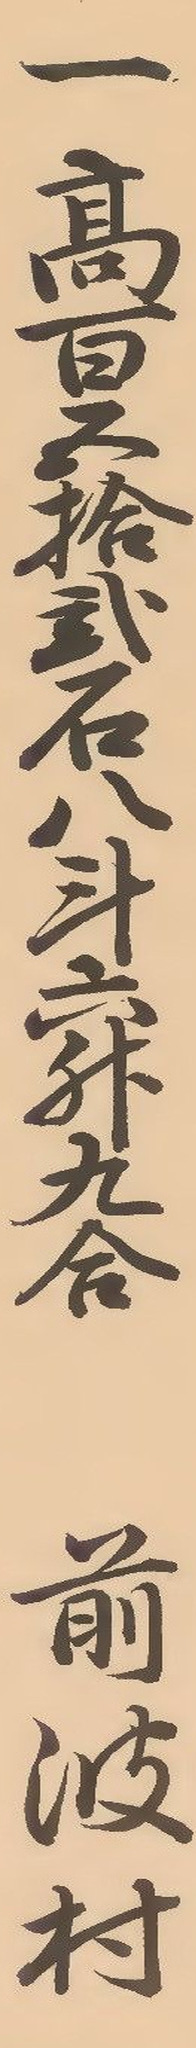一高百五拾弐石八斗六升九合前波村
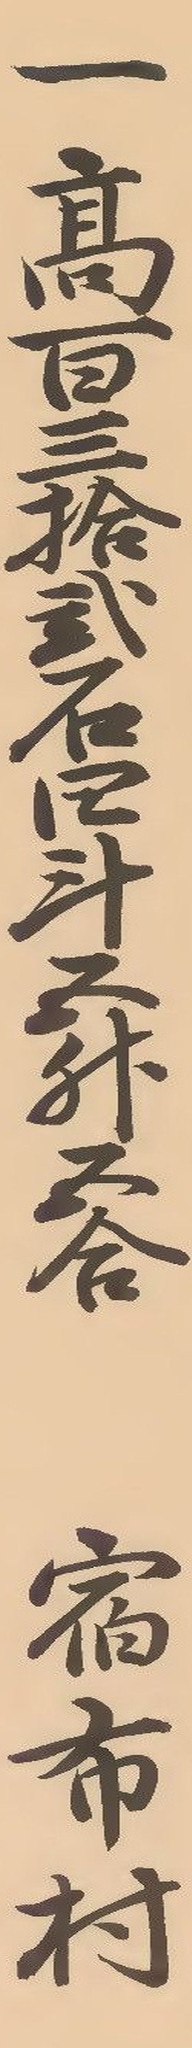一高百三拾弐石四斗五升五合宿布村
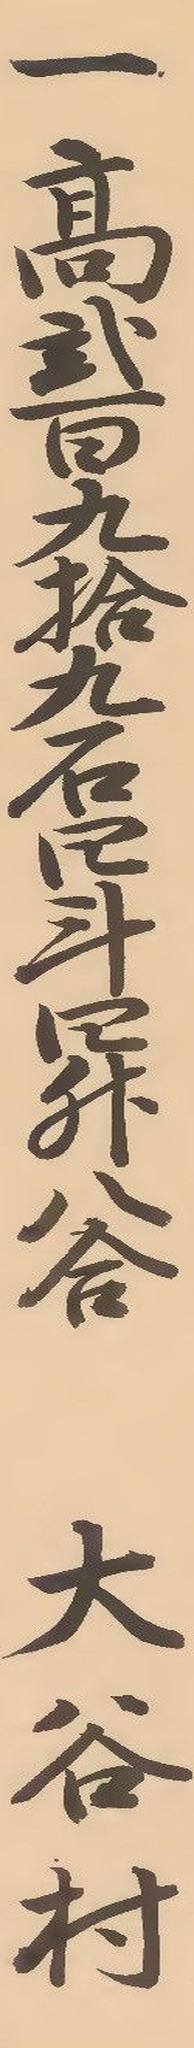一高弐百九拾九石四斗四升八合大谷村
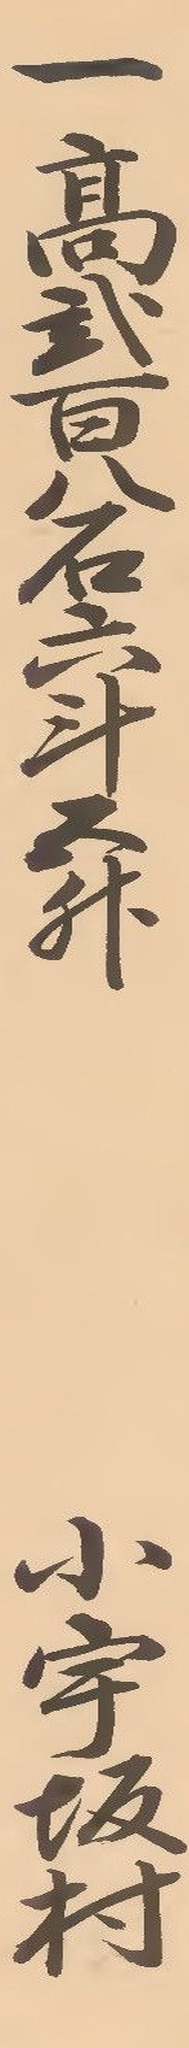一高弐百八石六斗五升小宇坂村
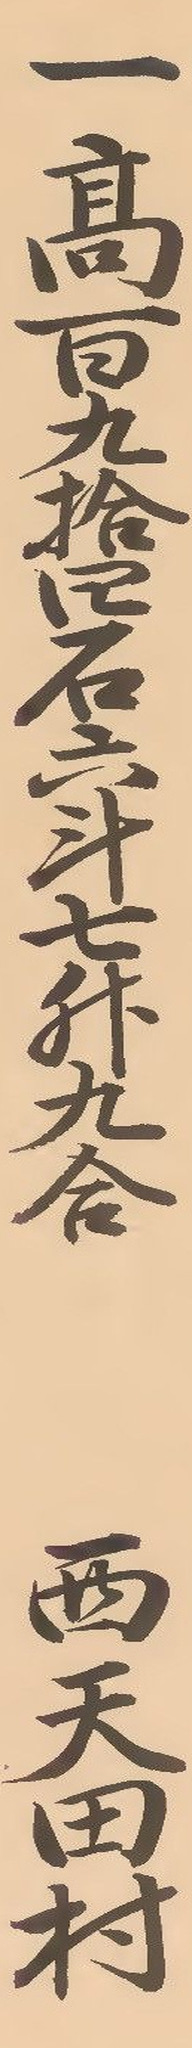一高百九拾四石六斗七升九合西天田村
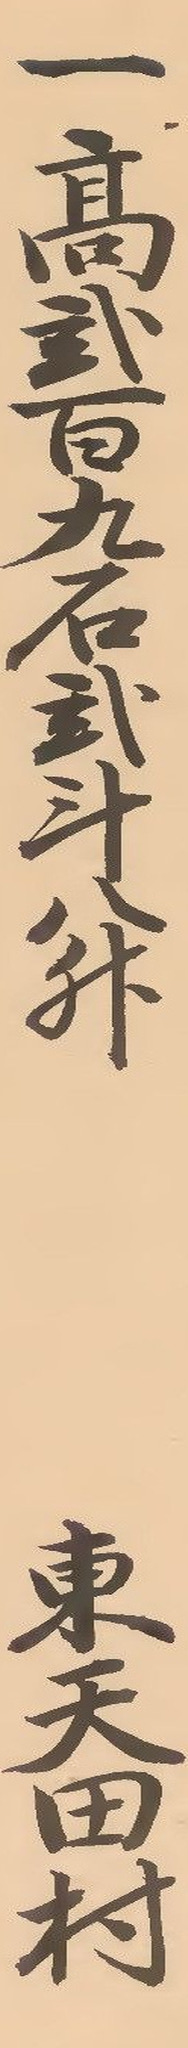一高弐百九石弐斗八升東天田村
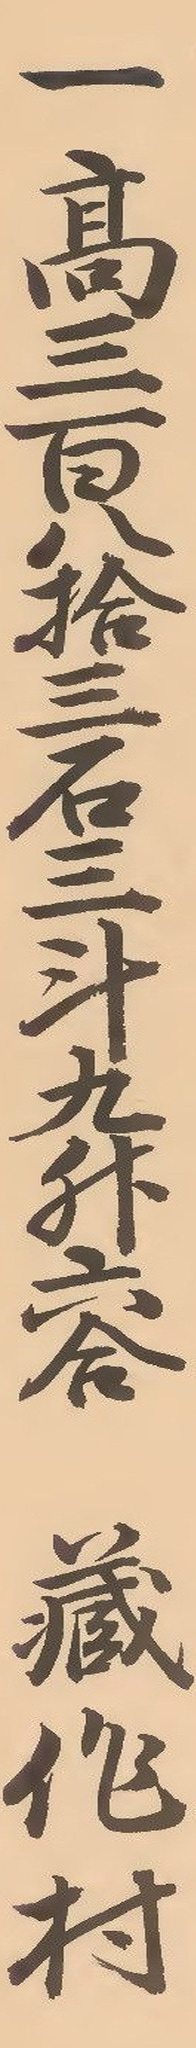一高三百八拾三石三斗九升六合蔵作村

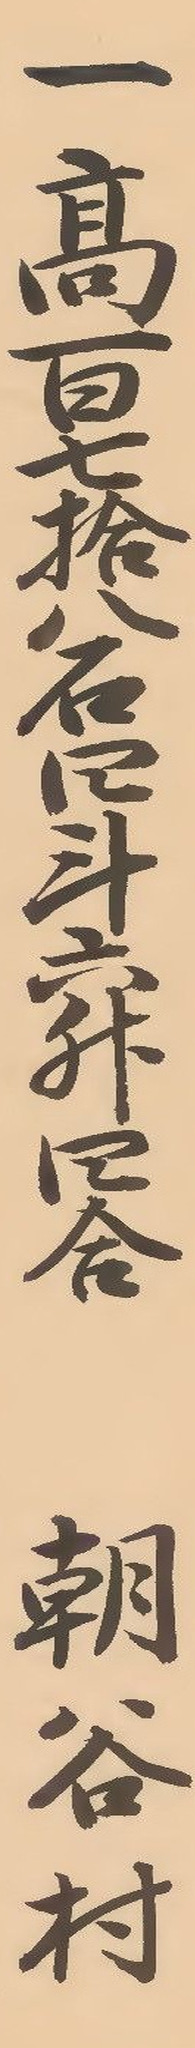一高百七拾八石四斗六升四合朝谷村
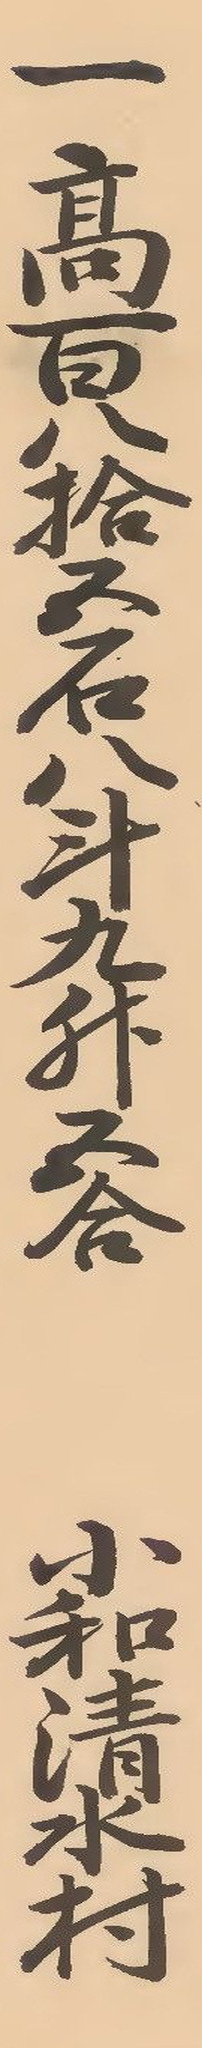一高百八拾五石八斗九升五合小和清水村
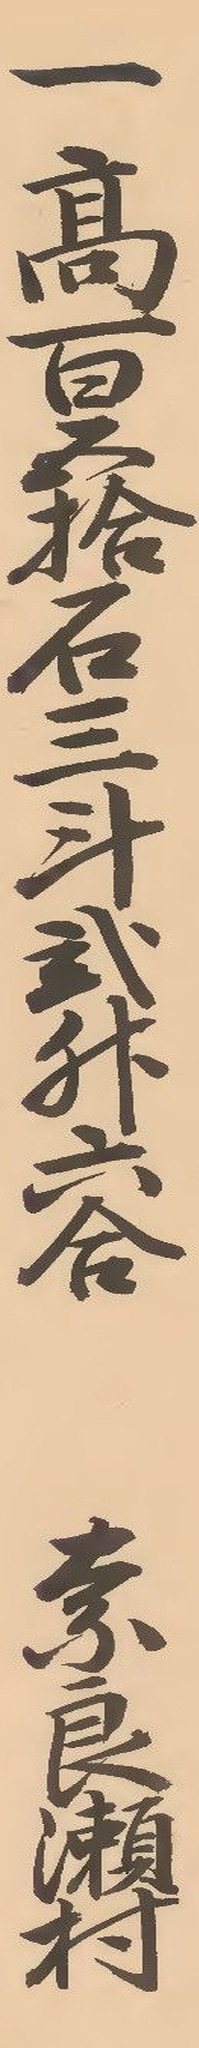一高百五拾石三斗弐升六合奈良瀬村
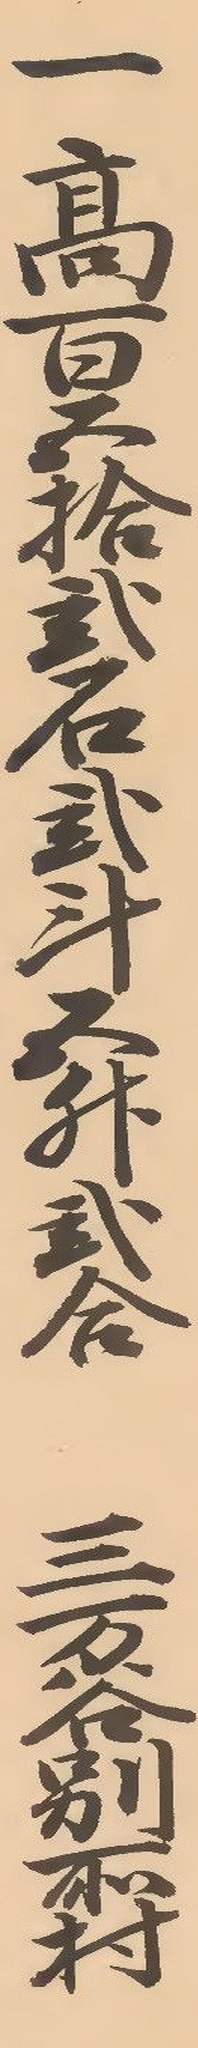一高百五拾弐石弐斗五升弐合三万谷別所村
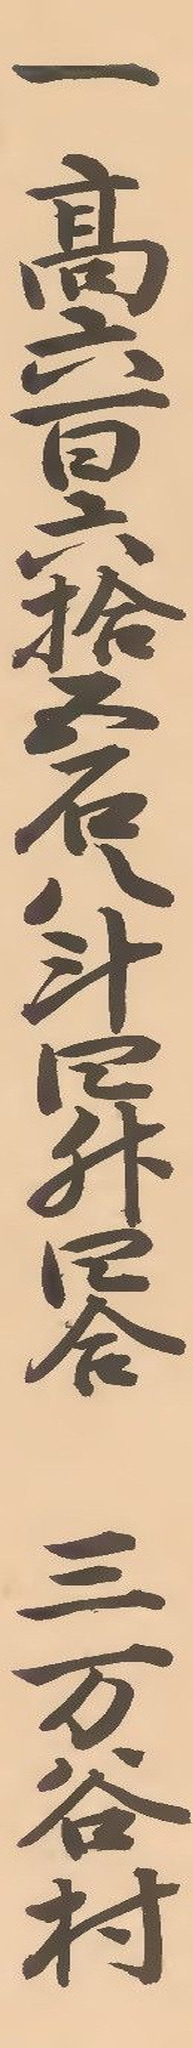一高六百六拾五石八斗四升四合三万谷村
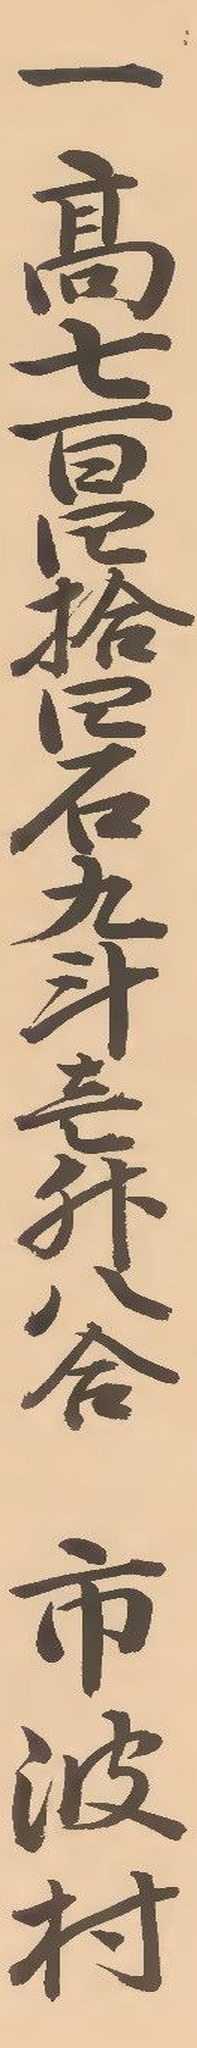一高七百四拾四石九斗壱升八合市波村
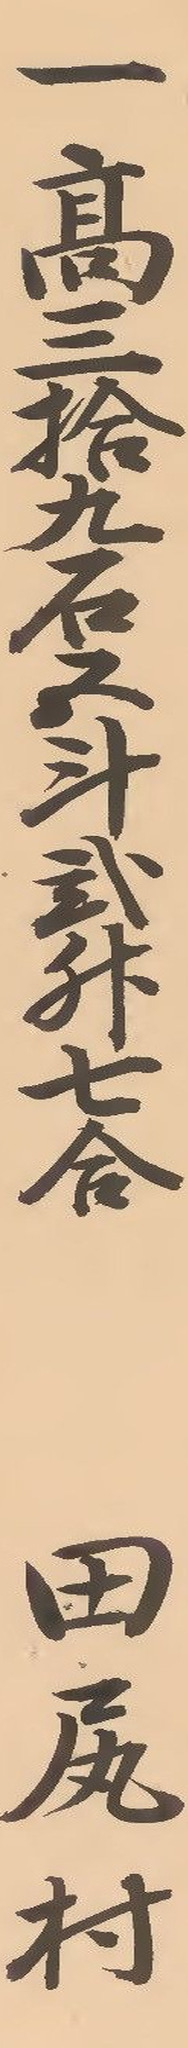一高三拾九石五斗弐升七合田尻村
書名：越前国郷帳
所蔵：国立公文書館 National Archives of Japan
